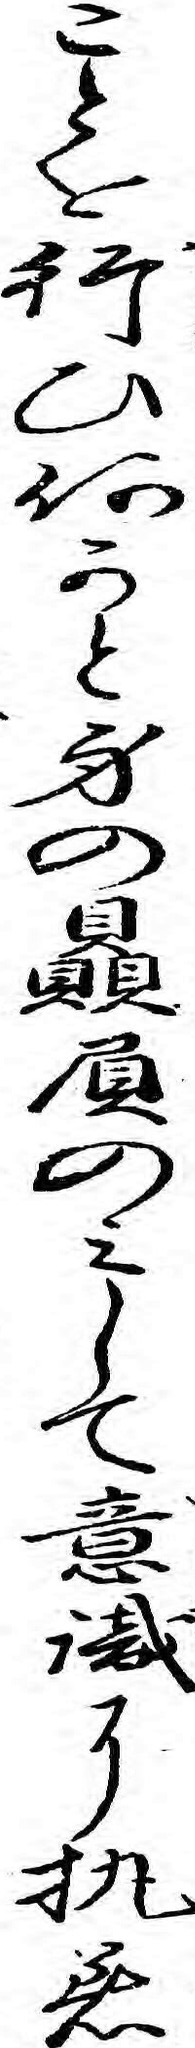ことを行ひ何かと身の贔屓のみして意識に執着
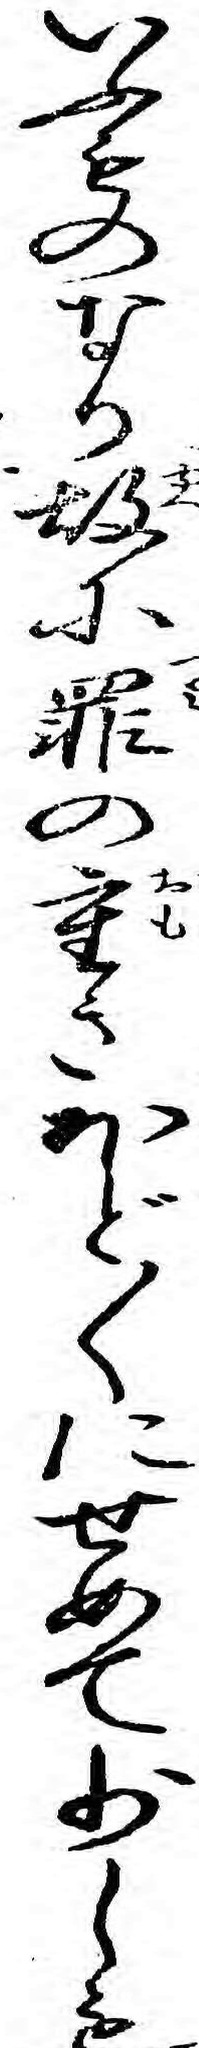いふものなり故に罪の重きほど〳〵にせめて少しも
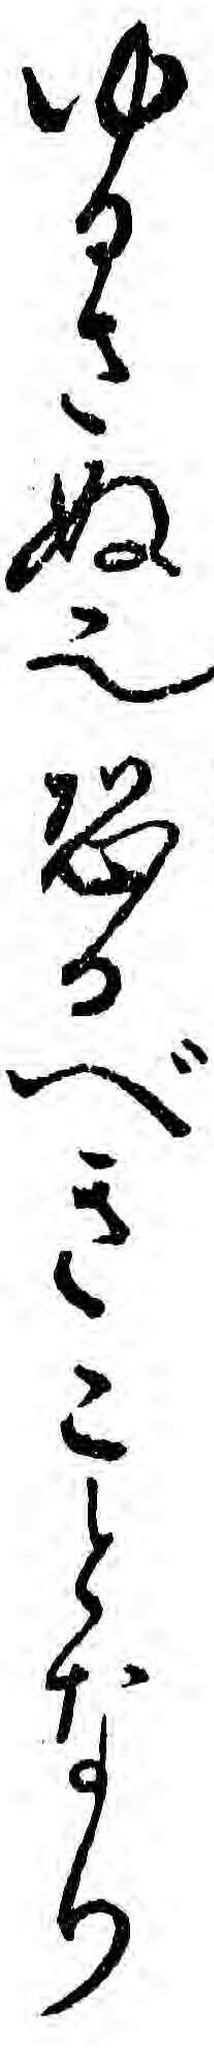ゆるさぬ也恐るべきことなり
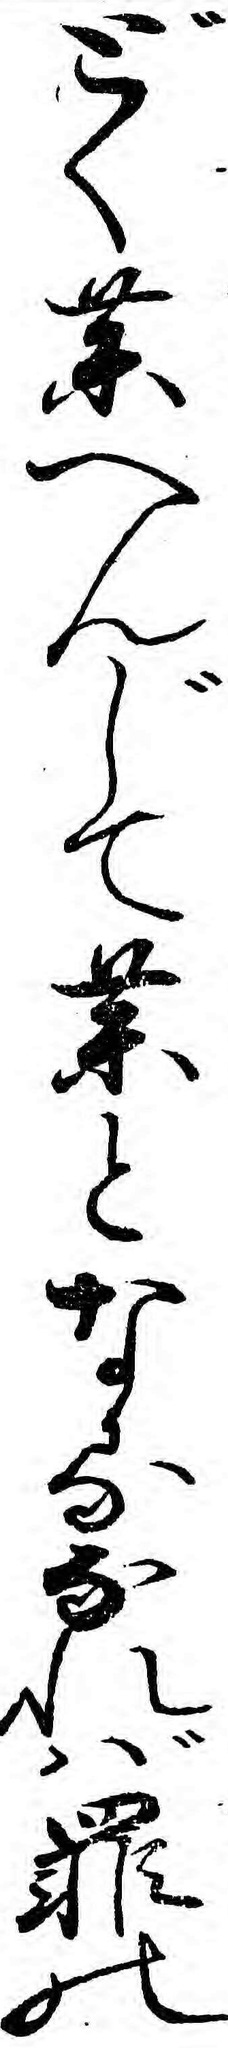どく薬へんじて薬となるなれば罪の
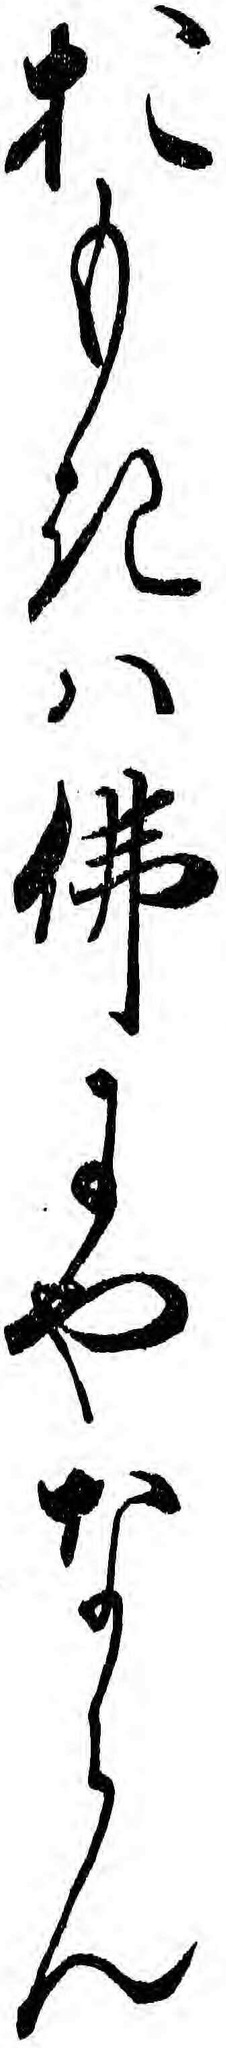おもきは仏にやならん
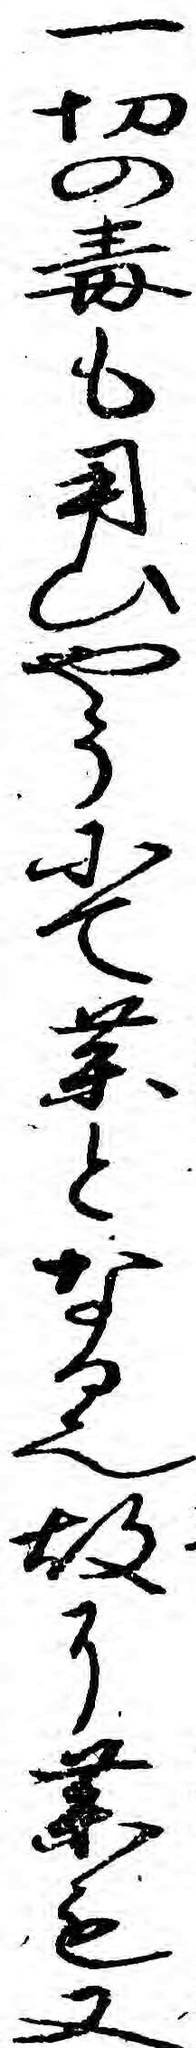一切の毒も用ひやうにて薬となる也故に薬も又

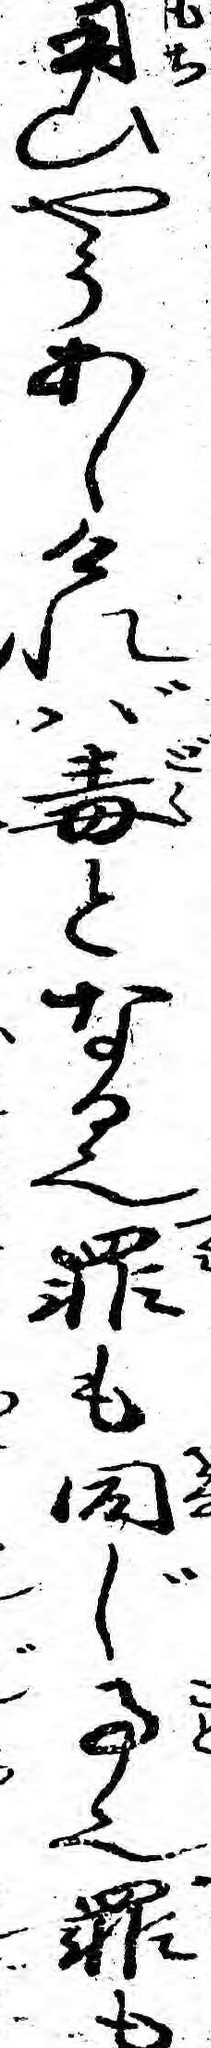用ひやうあしければ毒となる也罪も同じ事也罪も
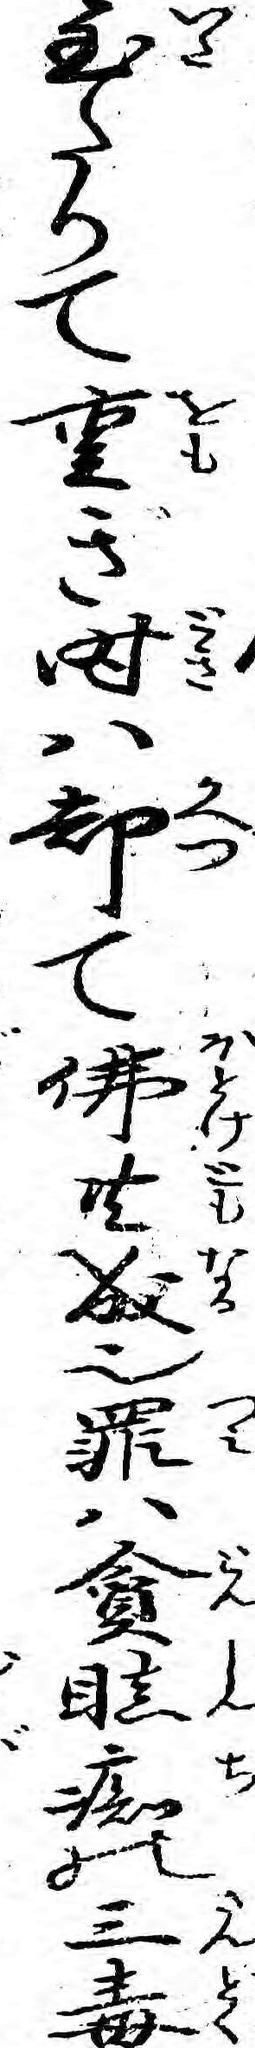至たりて重き時は却て仏共成也罪は貪瞋痴の三毒
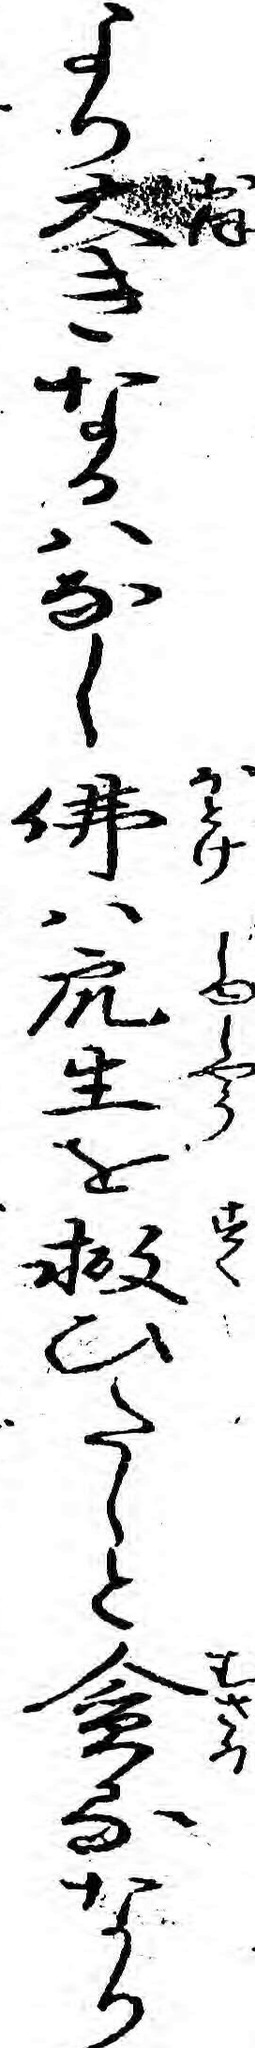より大きなるはなし仏は衆生を救ひたしと貪るなり
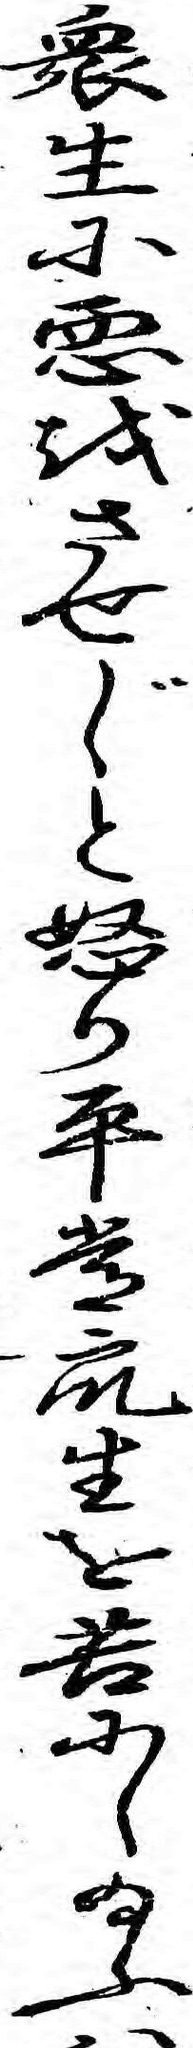衆生に悪をさせじと怒り平常衆生を苦にし給ふは
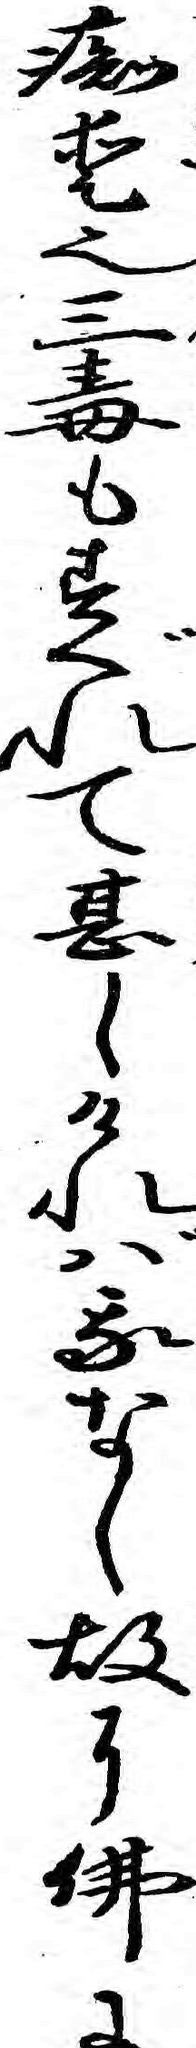痴愛也三毒もすぐれて甚しければ我なし故に仏に
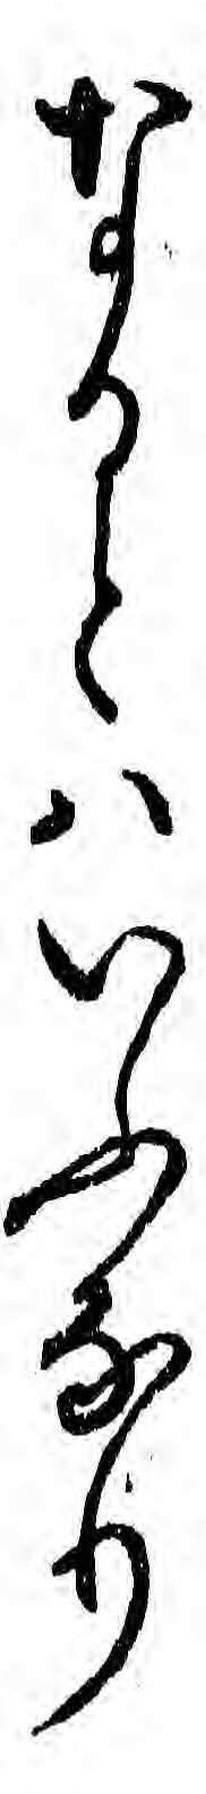なるとはいふなり
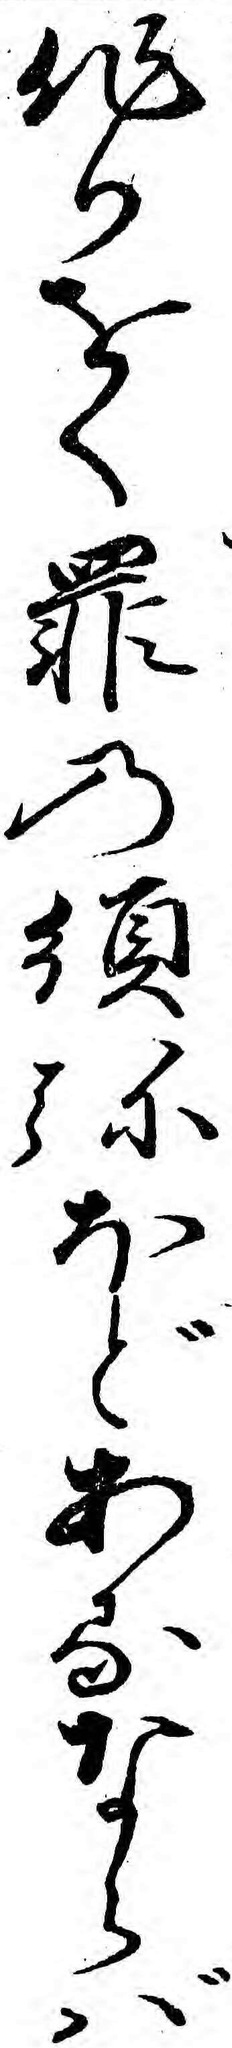作りをく罪の須弥ほどあるならば
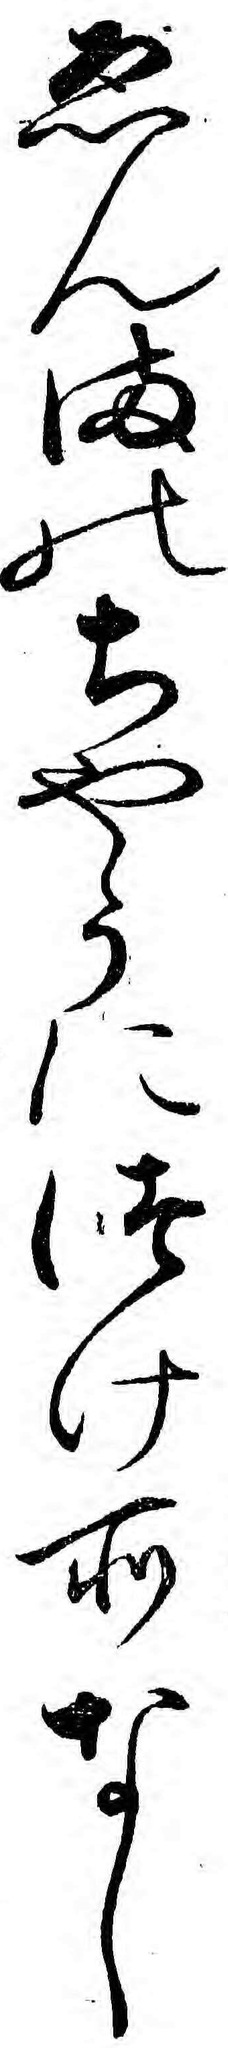ゑんまのちやうにつけ所なし
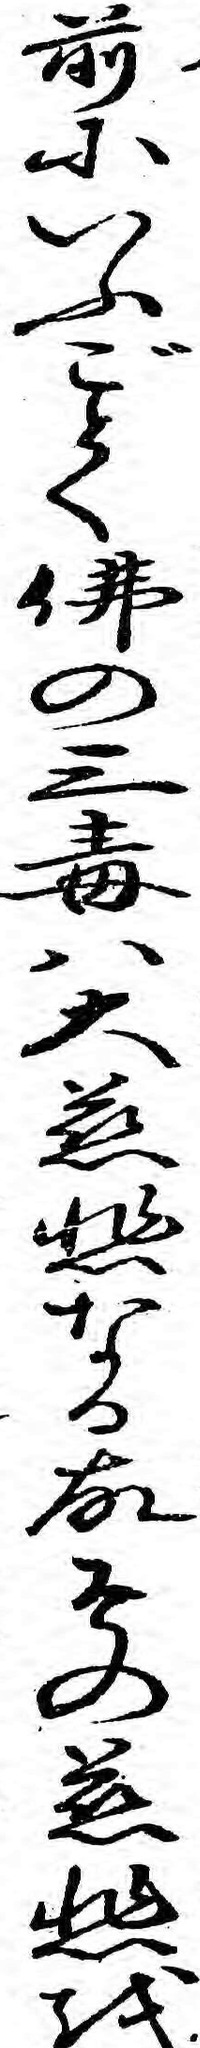前にいふごとく仏の三毒は大慈悲なる故その慈悲を
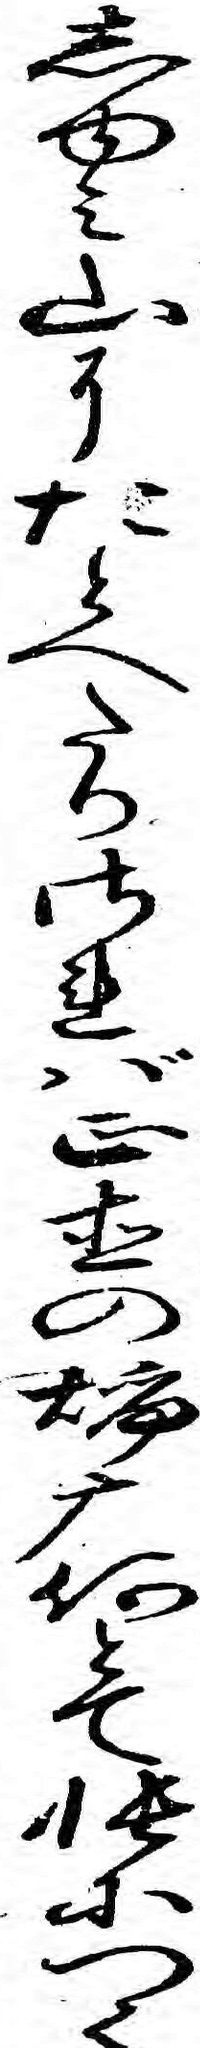しゆみ山にたとへたりされば正直の焔魔何とて帳につく
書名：目なし用心抄
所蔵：国文学研究資料館
